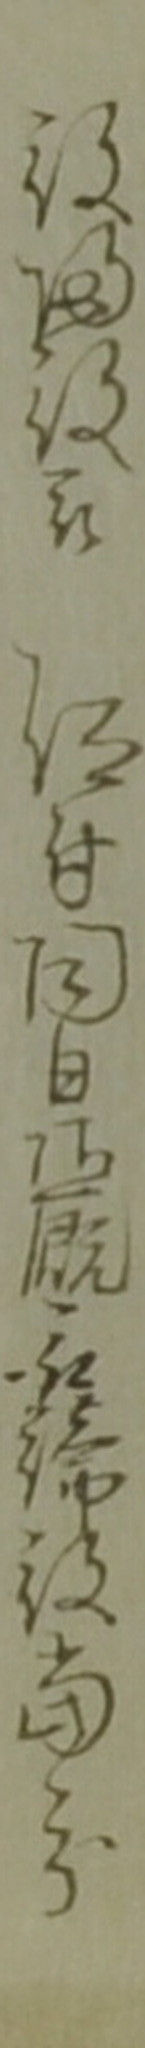役帰被仰付同日御厩取締役当分
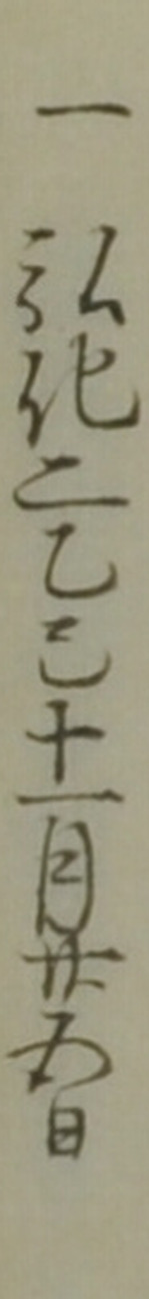一弘化二乙巳十一日廿五日
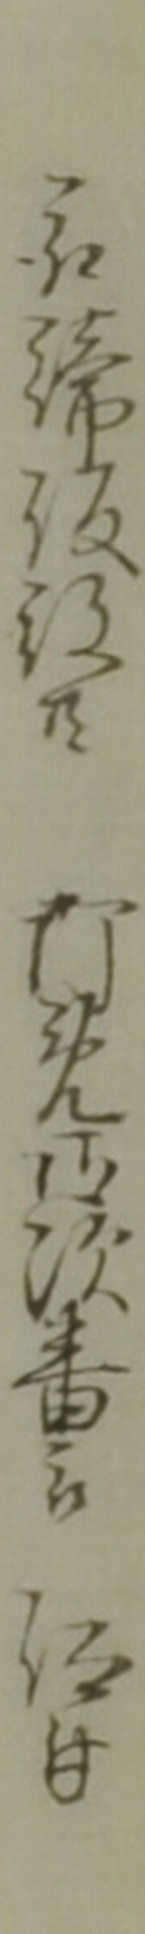取締仮役共御免御次番被仰付
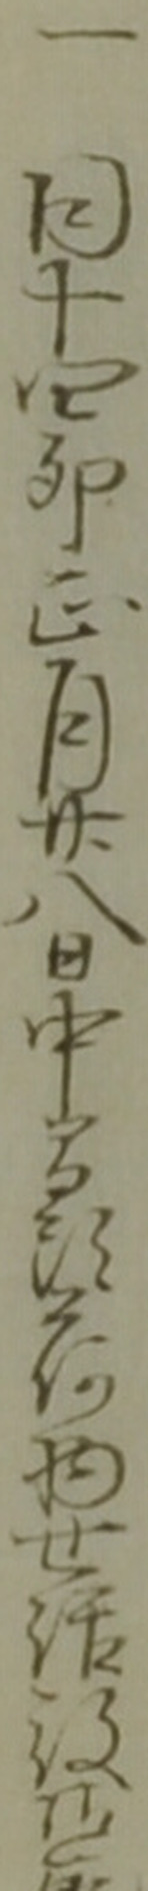一同十四卯正月廿八日中間頭世話役御厩
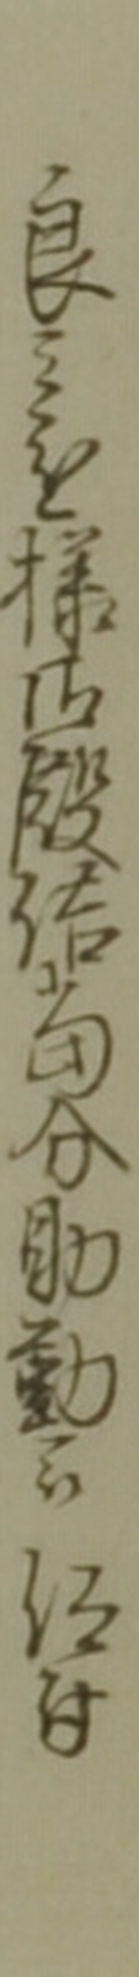良之進様御殿詰当分助勤被仰付
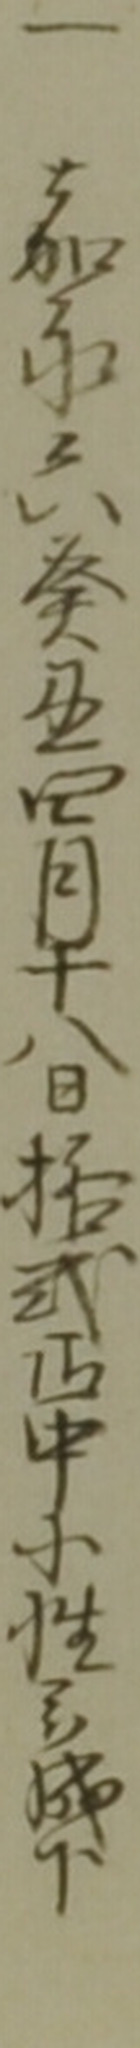一嘉永六癸丑四月十八日格式御中小性被成下
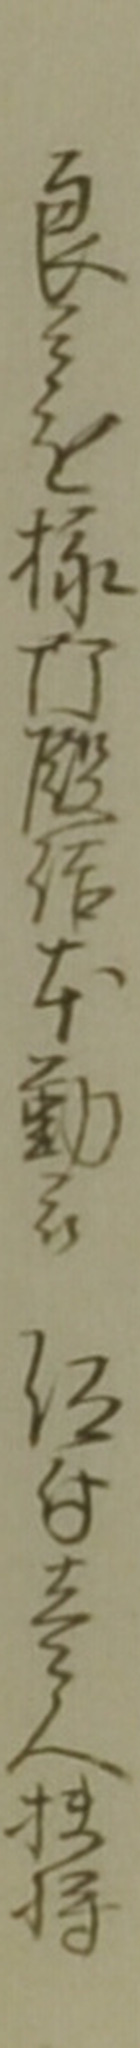良之進様御殿詰本勤被仰付壱人扶持

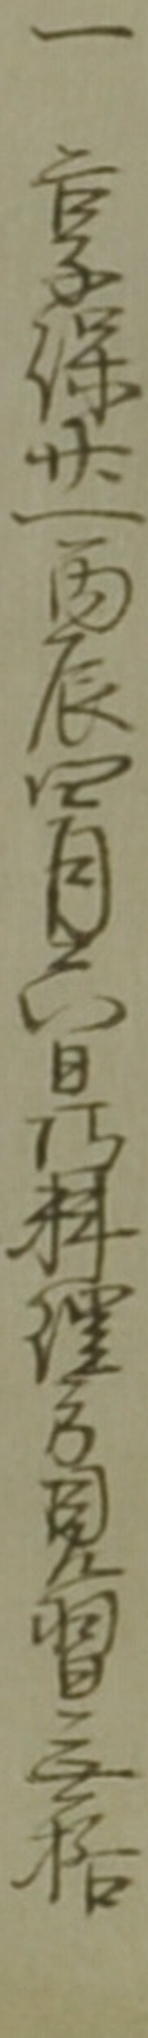一享保廿一丙辰四月六日御料理方見習無格
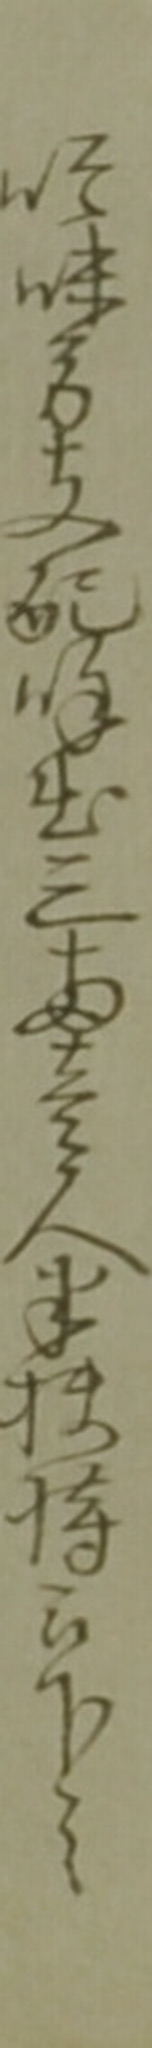吟味方支配呼出三両壱人半扶持被下之
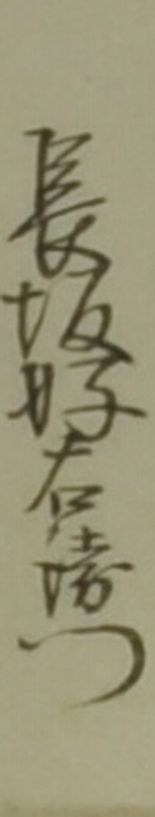長坂好右衛門
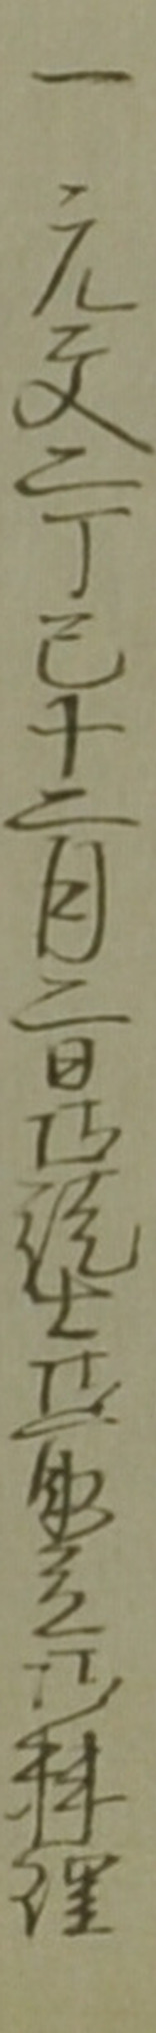一元文二丁巳十二月二日御徒士御取立御料理
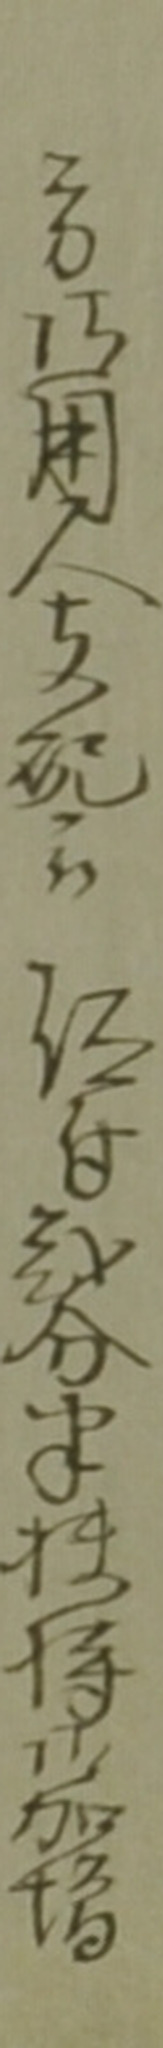方御用人支配被仰付弐分半扶持御加増
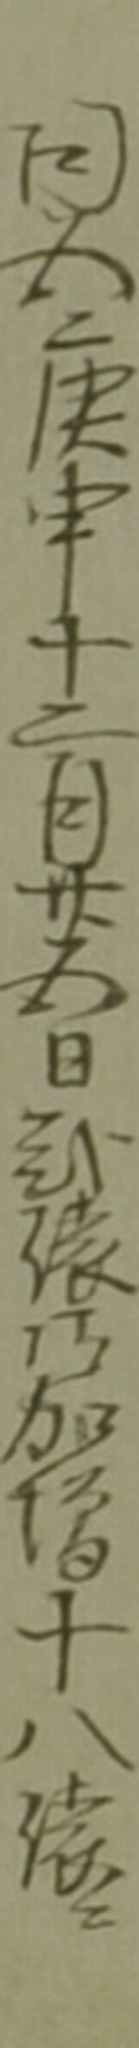一同五庚申十二月廿五日弐俵御加増十八俵ニ

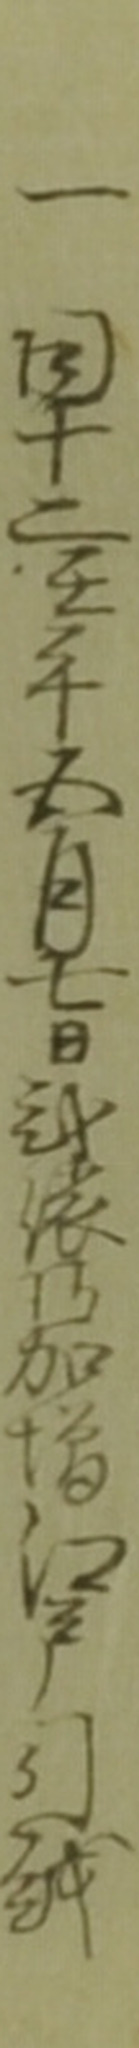一同十二壬午五月七日弐俵御加増江戸引越
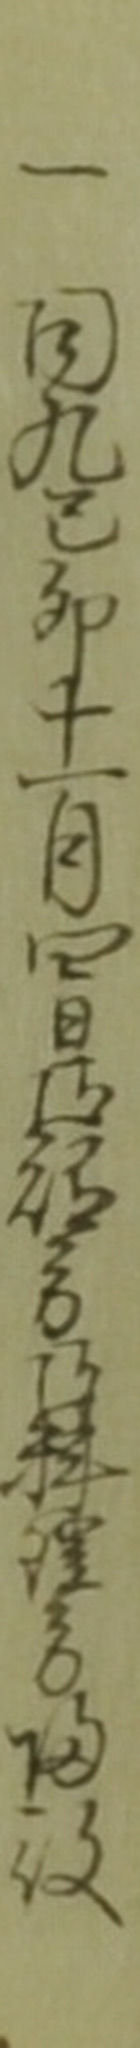一同九己卯十一月四日御賄方御料理方帰役
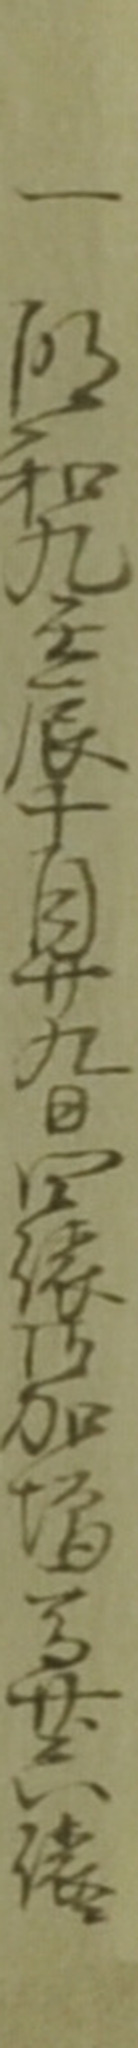一明和九壬辰十月廿九日四俵御加増高廿六俵
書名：無足諸士勤仕録（二）
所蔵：伊那市立高遠町図書館・合同会社AMANE
